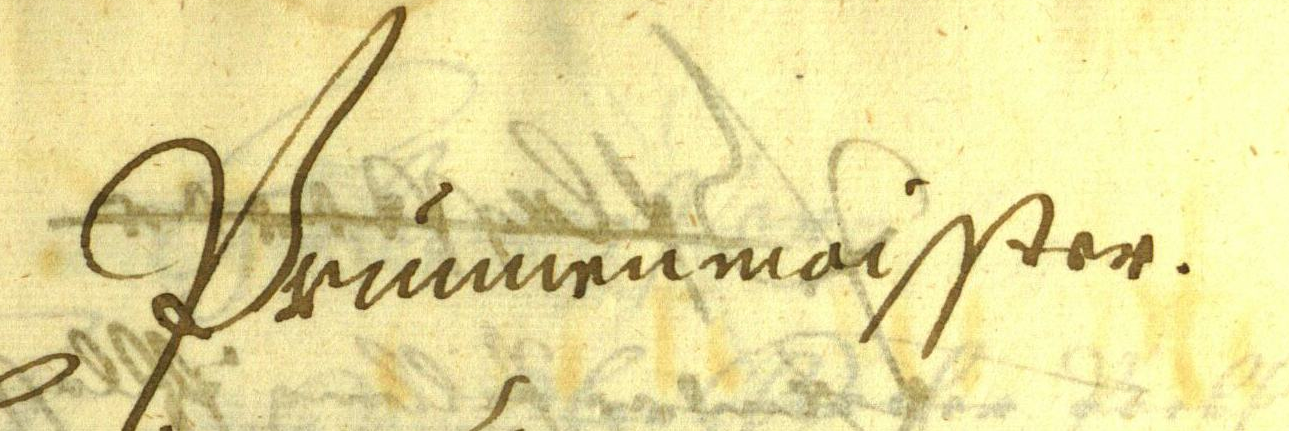Prūnnenmaisster.
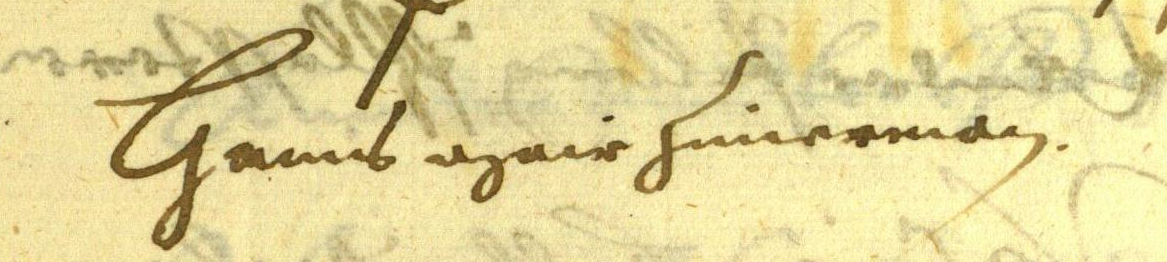Hanns Mair Zimerman.
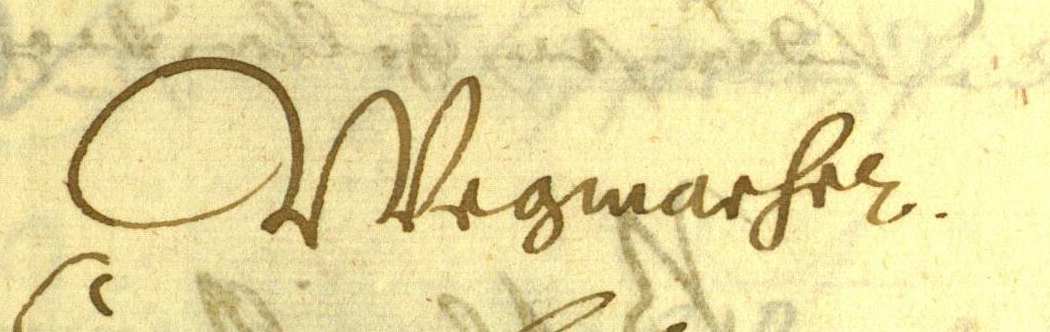Wegmacher.
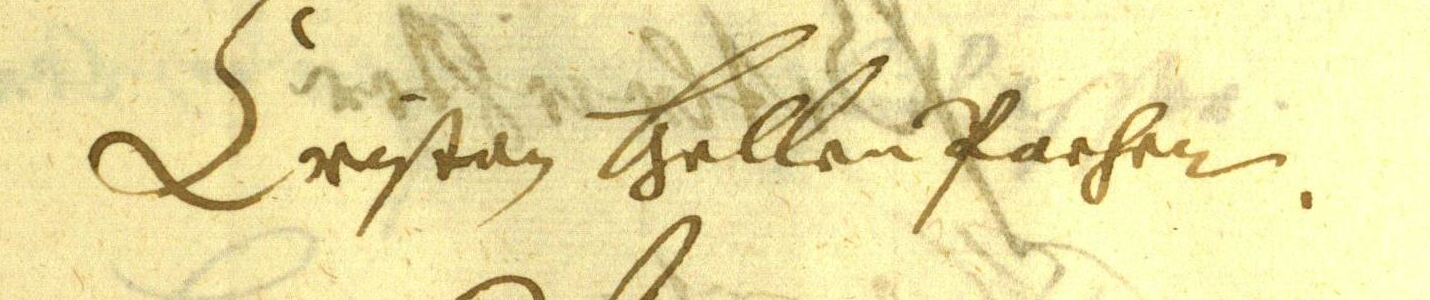Cristan HellenPacher.
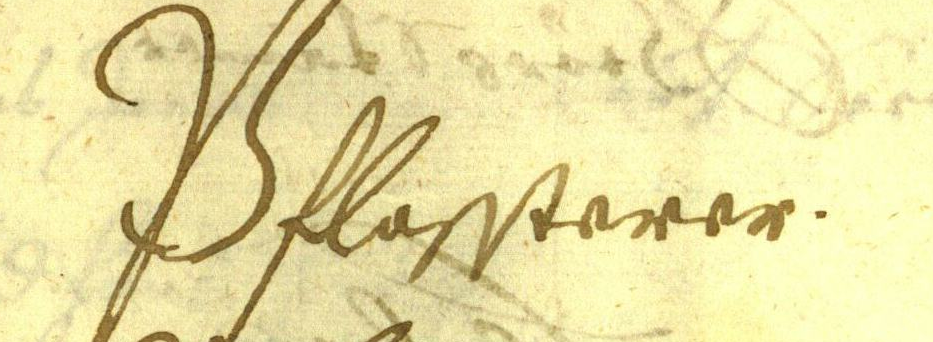Pflassterer.
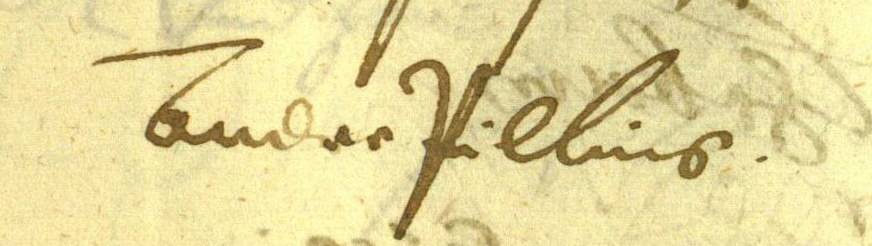Andre Pilling.
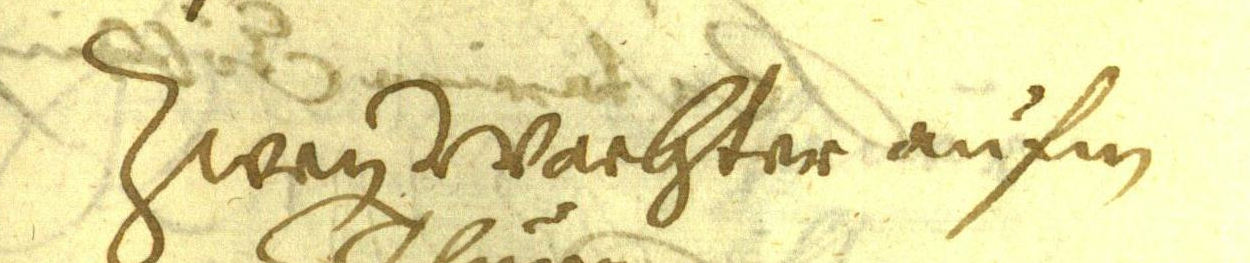Zwen Wachter aūfm
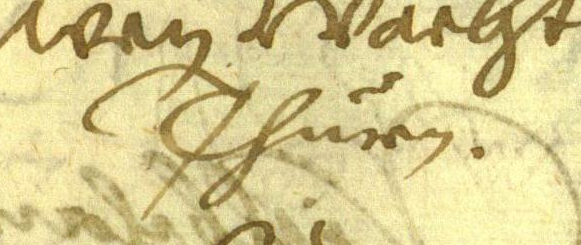Thūrn.
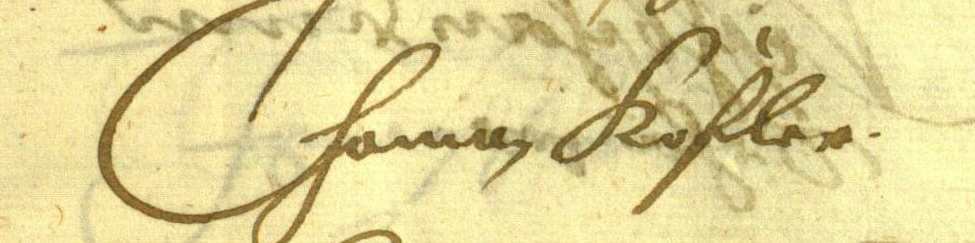Thoman Kōfler.
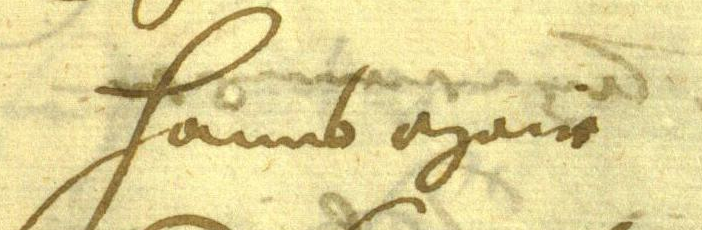hanns Mair
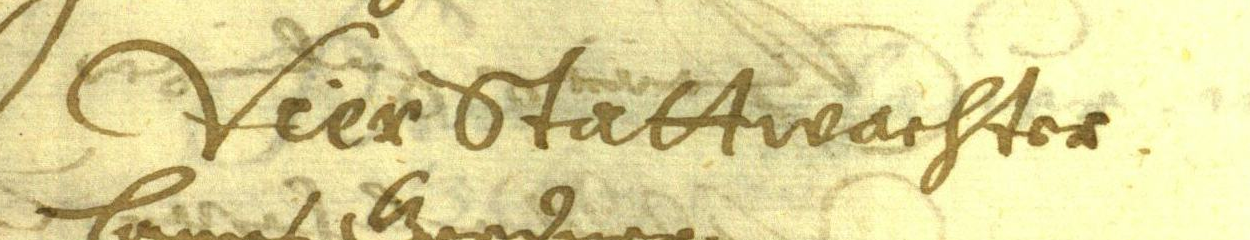Vier Stattwachter.
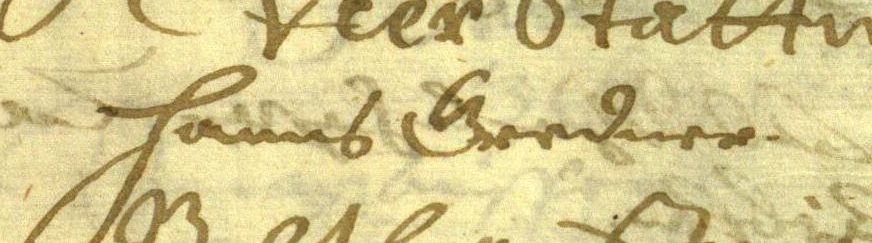hanns Gredner.
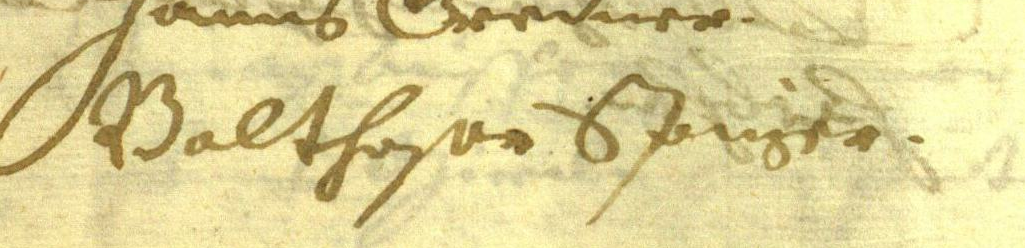Balthasar Spizer.
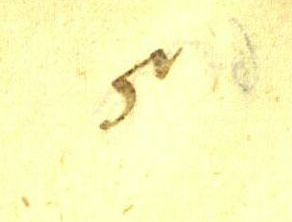5
